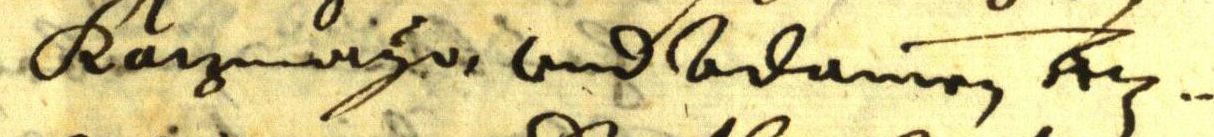Kazmayr, vnd Adamen Az¬
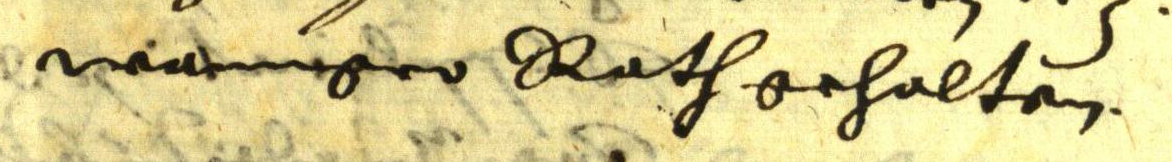wannger Rath gehalten.
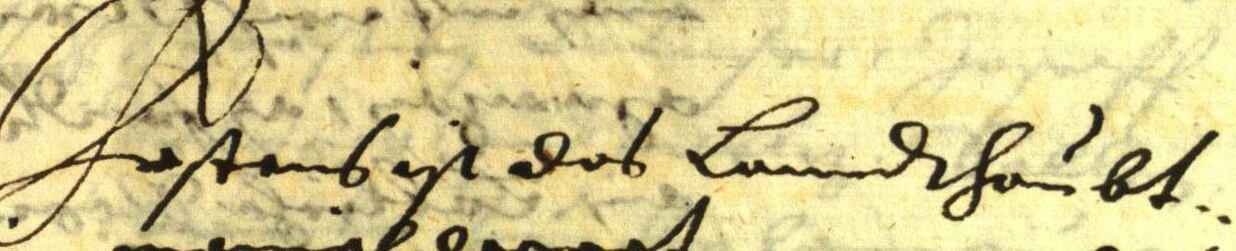Erstens ist das Lanndthaūbt¬
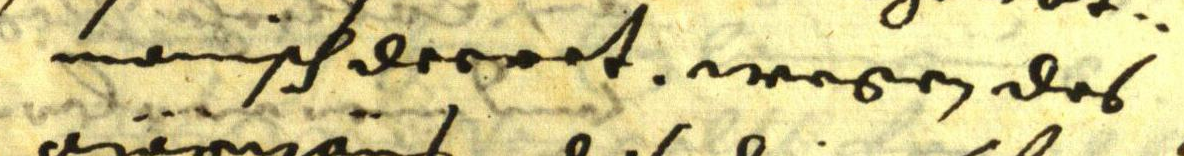manisch decret. wegen des
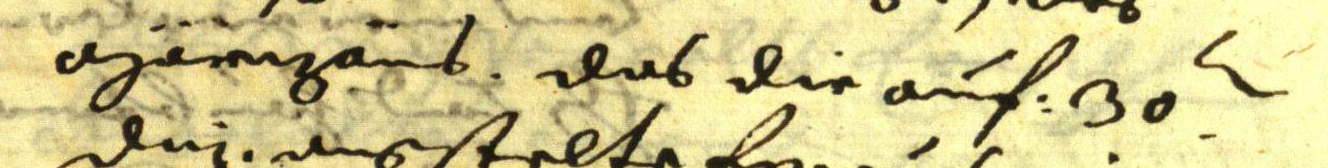Märzäns. das die aūf: 30.t
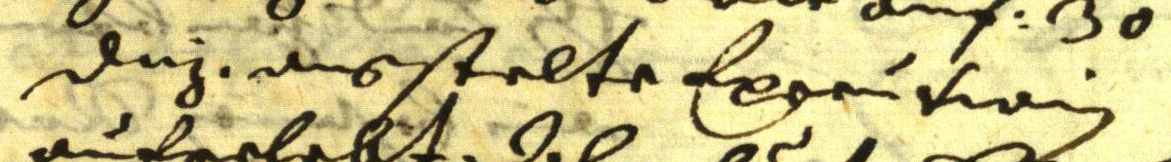diz. angstelte Execūtion
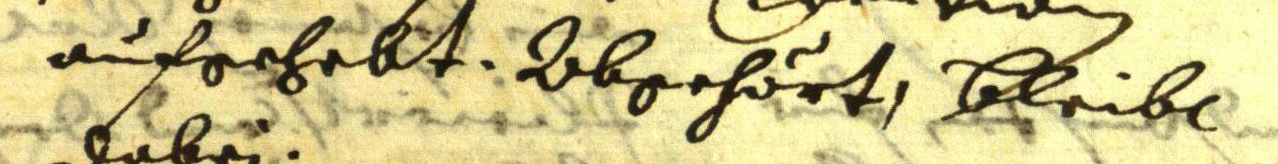aūfgehebt. Abgehōrt, bleibt
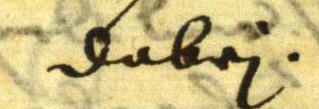dabej.
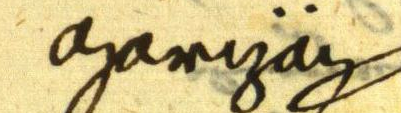Marzän.
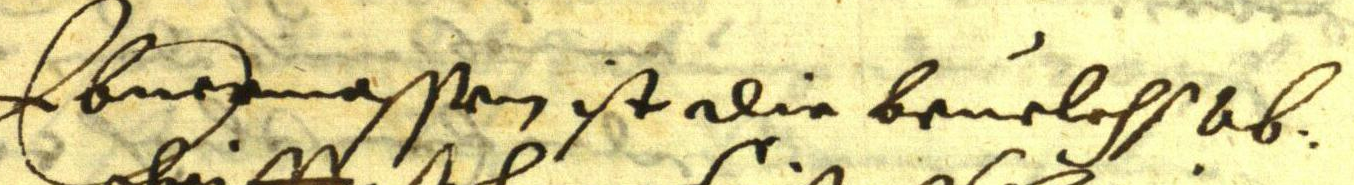Ebnermassen ist die beūelchs Ab¬
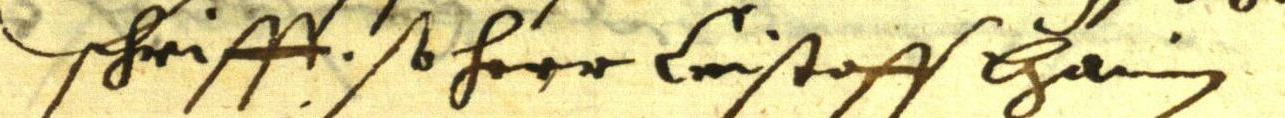schrifft. so herr Cristoff Haim
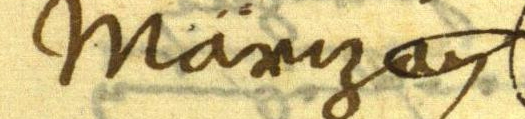Märzän
